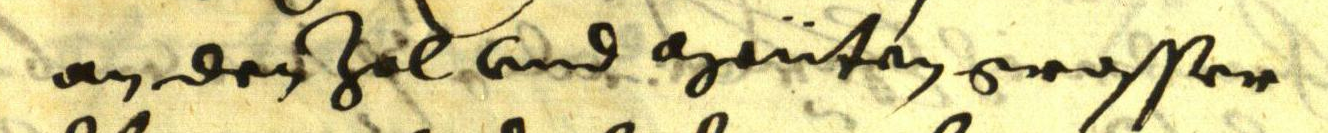an den Zal vnd Meüten grosser
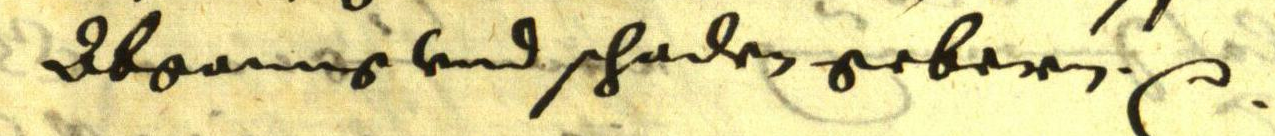Abganng vnd schaden gebern. etc.
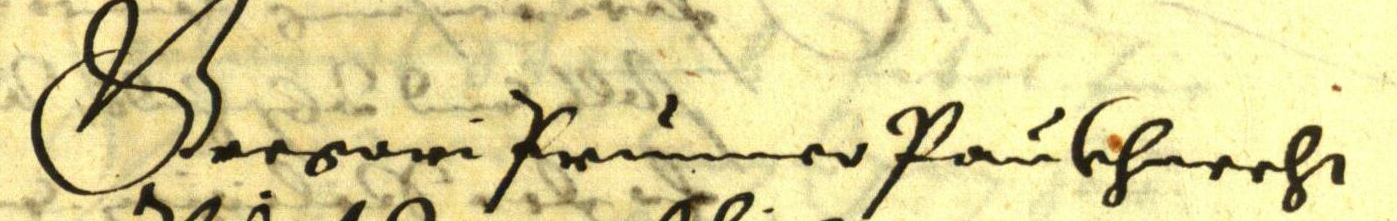Gregori Prūnner Paūkhnecht
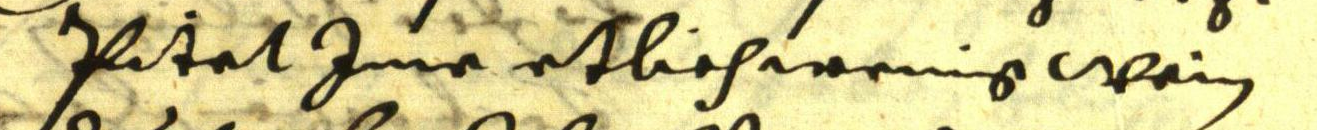Pitet Ime etlich wenig Wein
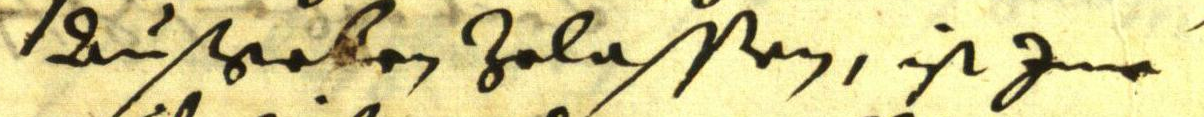Aūsgeben Zelassen, ist Ime
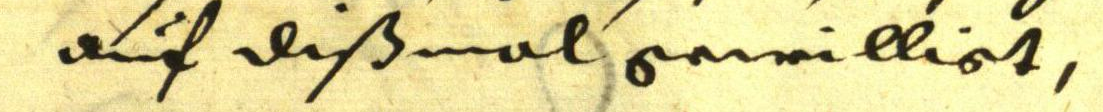aūf dißmal gewilligt,
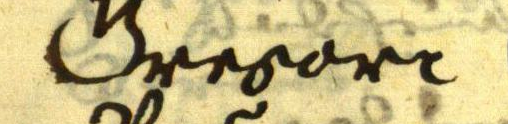Gregori
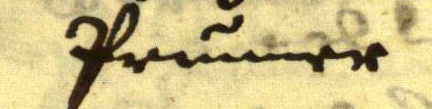Prūnner
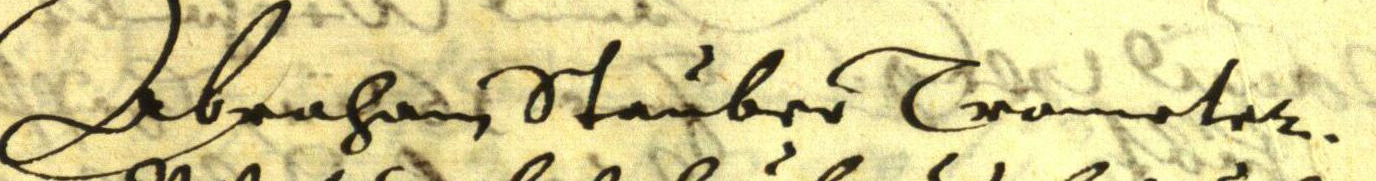Abraham Staūber Trometer.
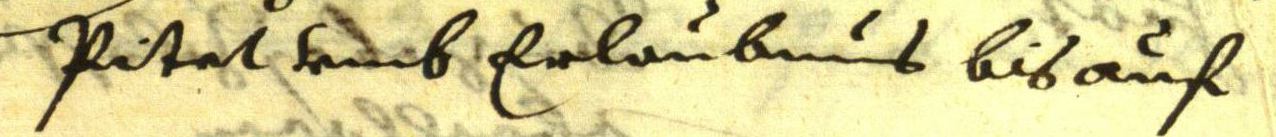Pitet vmb Erlaūbnūs bis aūf
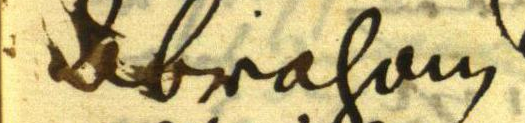Abraham
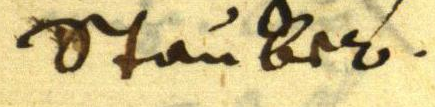Staūber.
